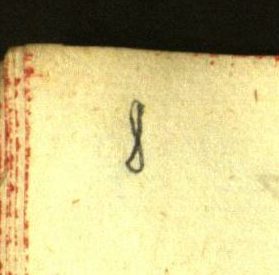8
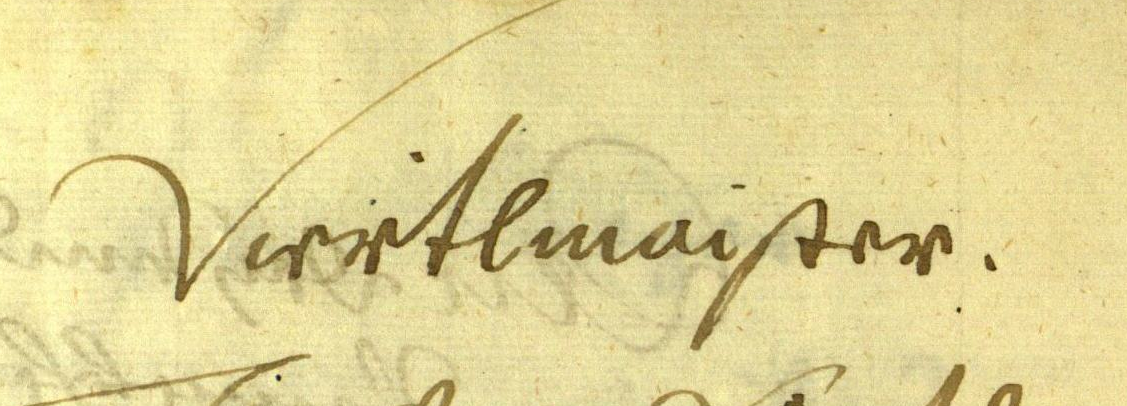Viertlmaister.
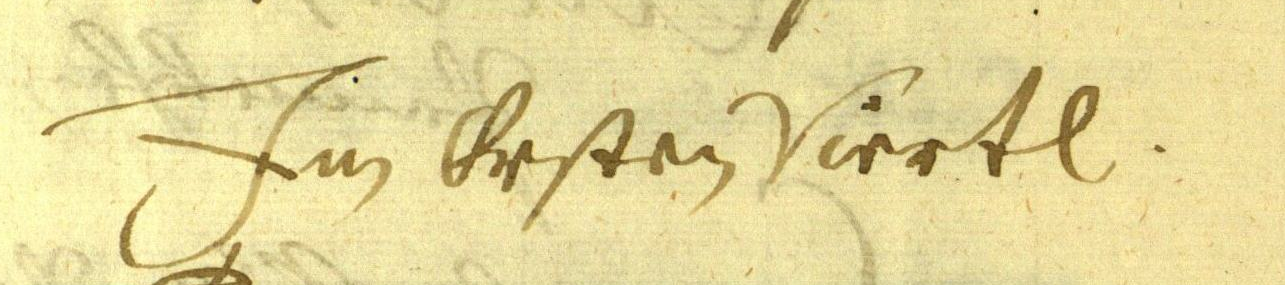Im Ersten Viertl.
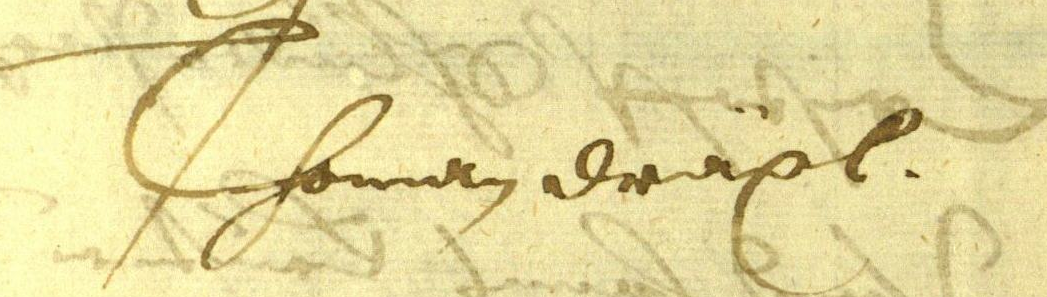Thoman dräxl.
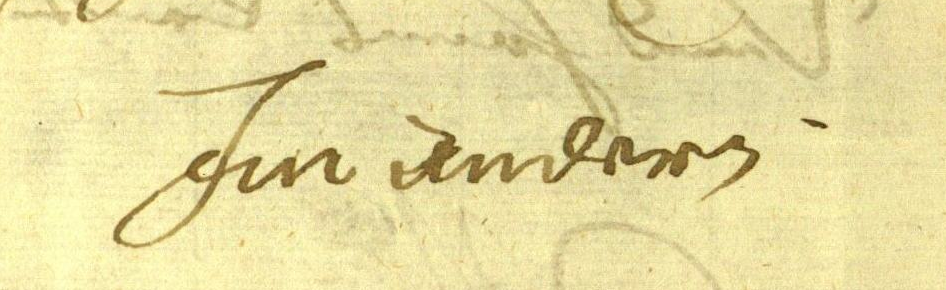Im Andern.
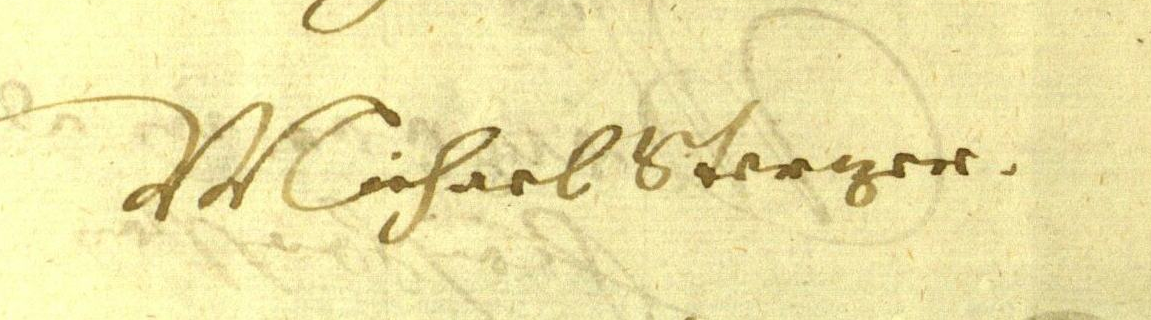Michael Sterzer.
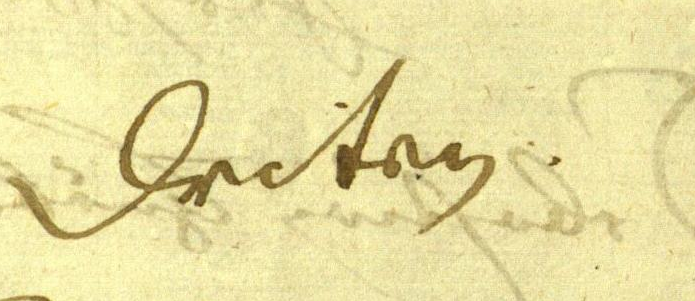Driten.
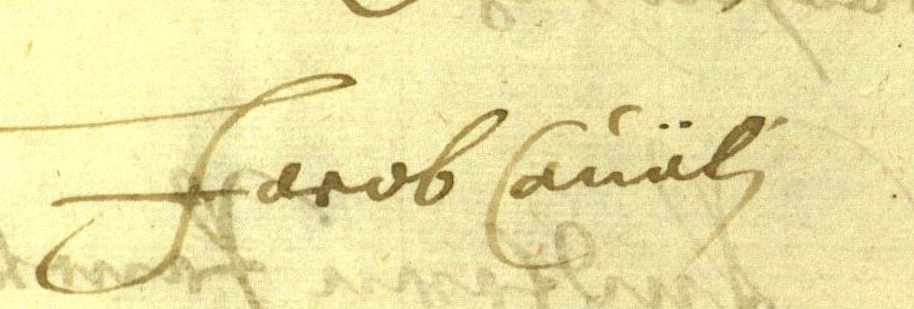Jacob Cānälj
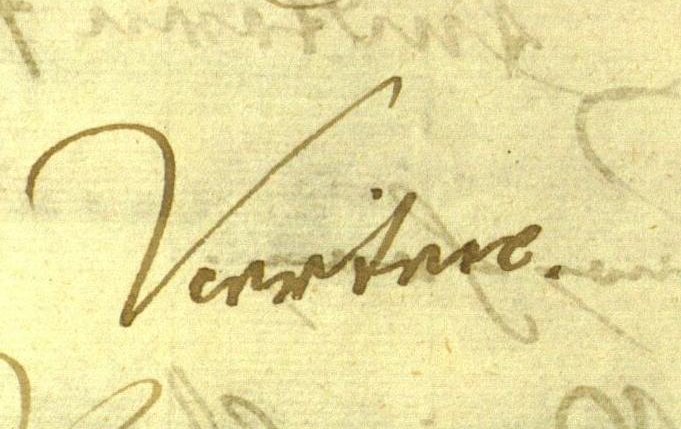Vierten.
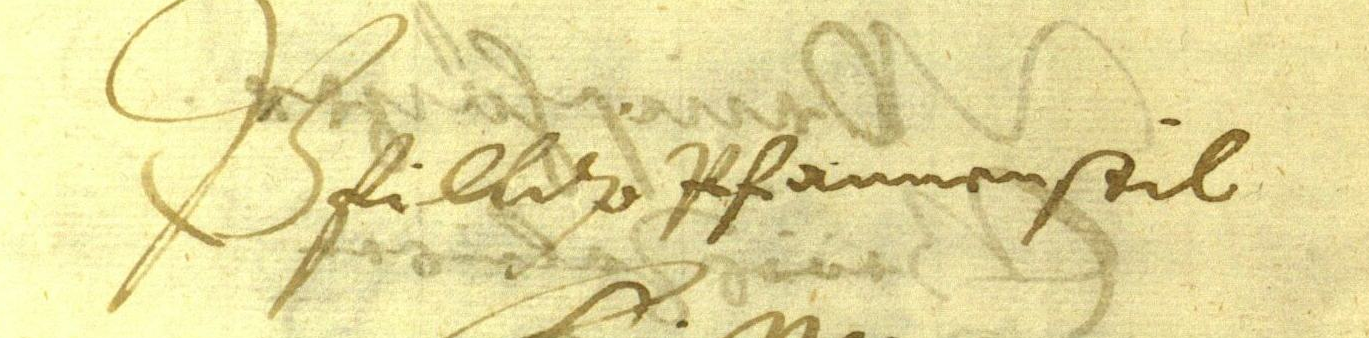Pfillip Pfannenstil
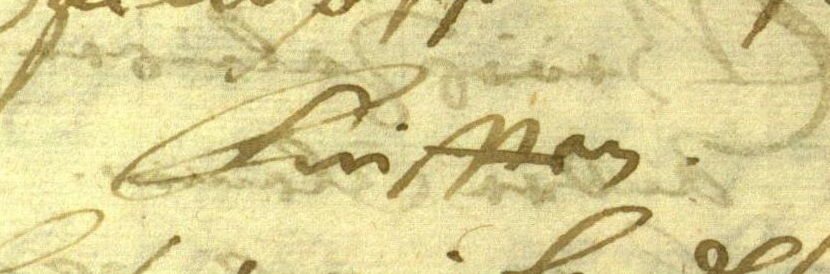Fūnfften.
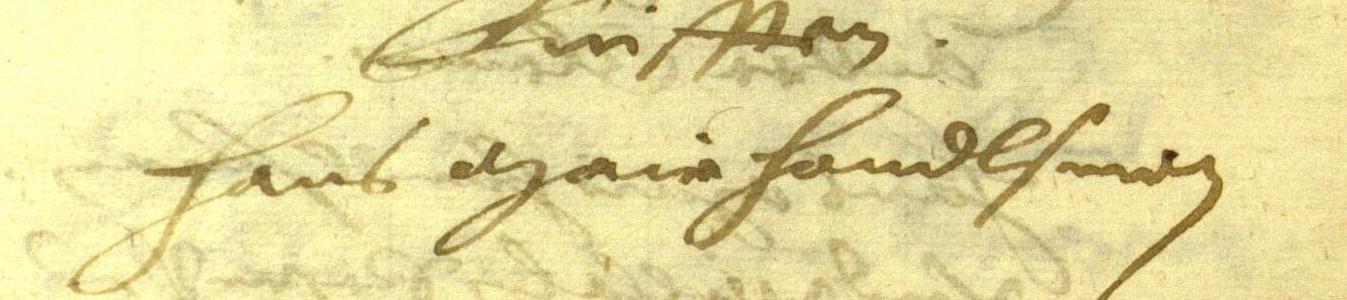hans Mair handlsman
